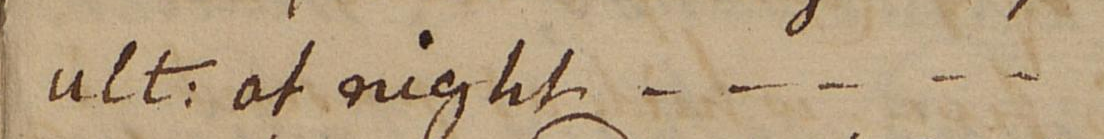ult: at night-----
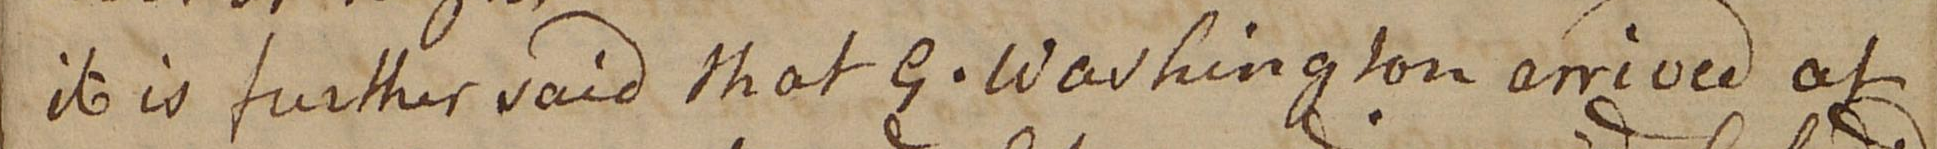it is further said that G. Washington arrived at
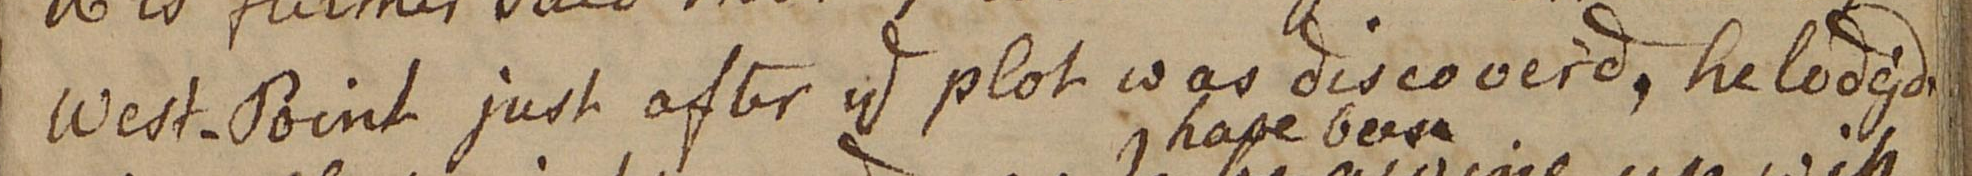West-Point just after y^e plot was discover'd, he lodg'd
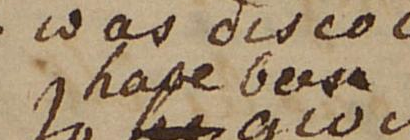have been
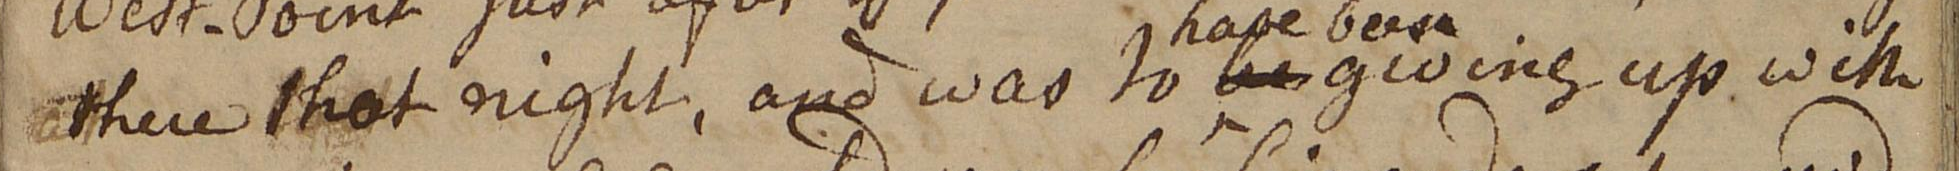there that night, and was to [be] giving up with
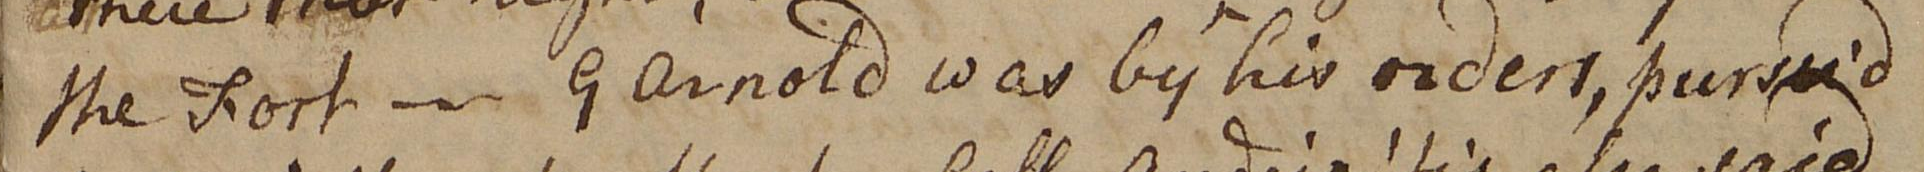the Fort- G Arnold was by his orders, pursu'd
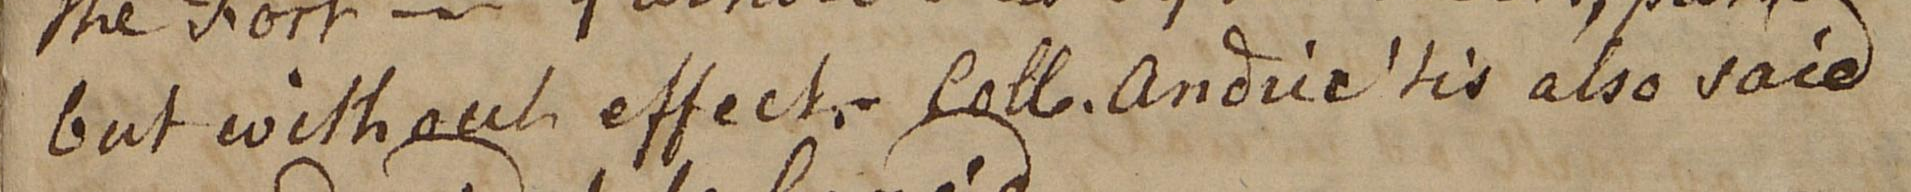but without effect- Coll. Andric 'tis also said
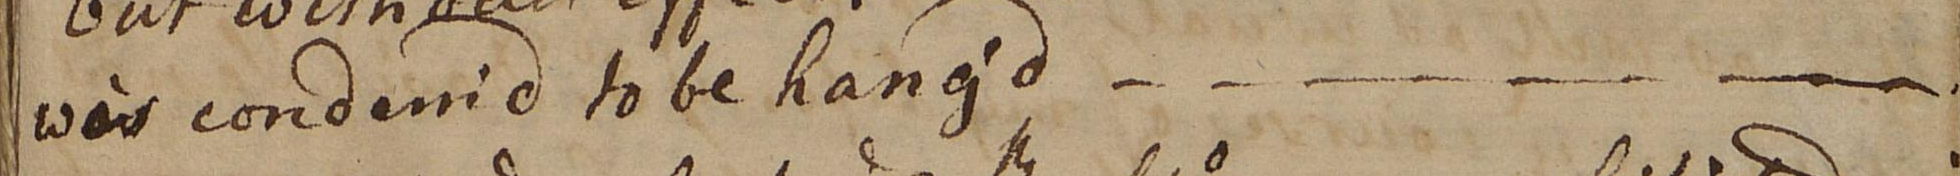was condem'd to be hang'd-----
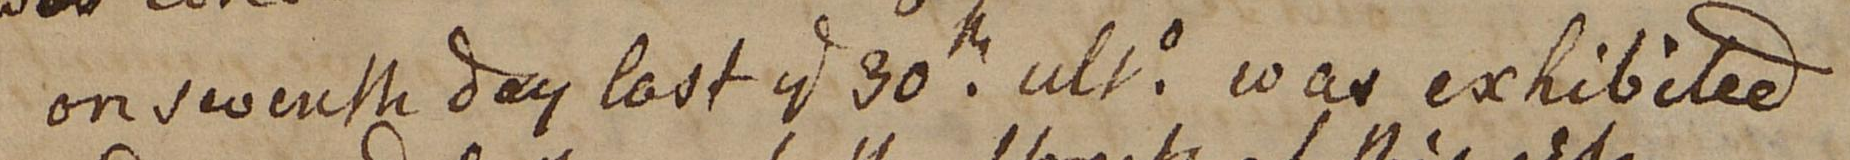on seventh day last y^e 30^th. ult^o. was exhibited
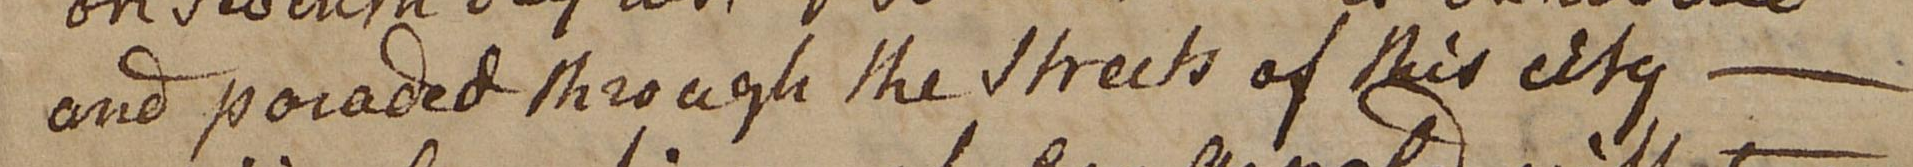and paraded through the Streets of this city-
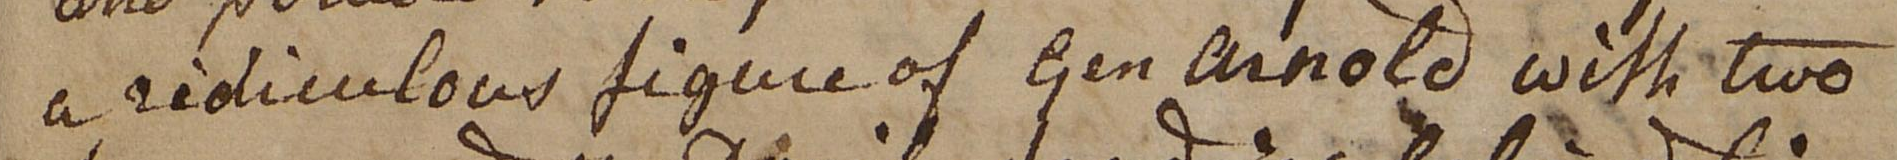a ridiculous figure of Gen Arnold with two
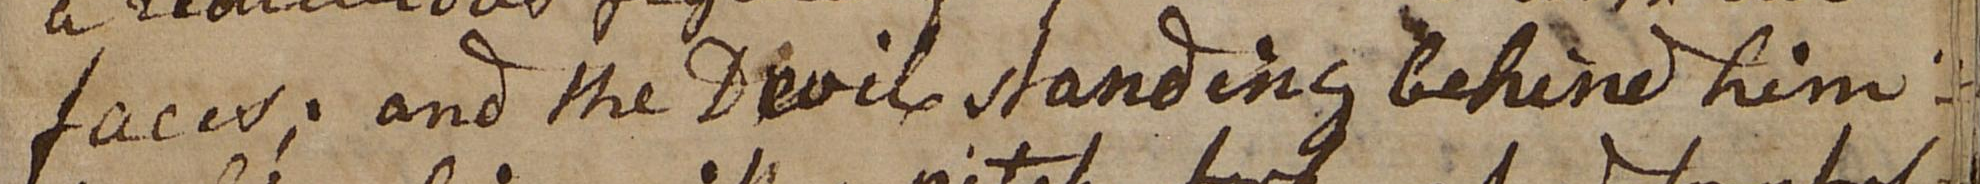faces; and the Devil standing behind him.
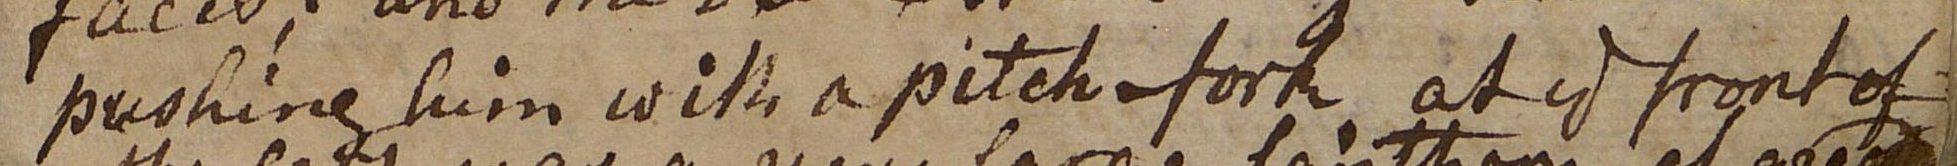pushing him with a pitch-fork at y^e front of
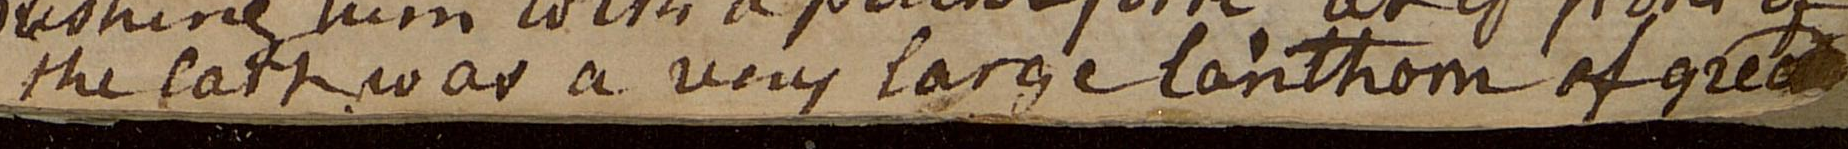the bath was a very large lanthom of great
